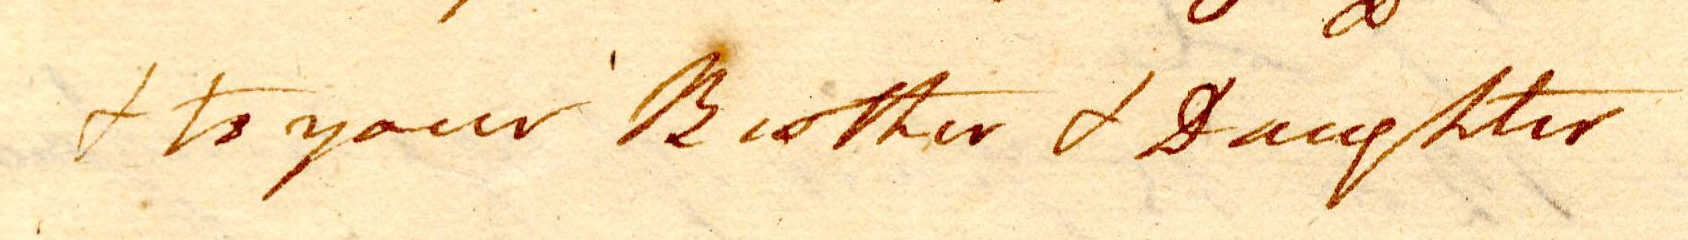& to your Bother & Daughter
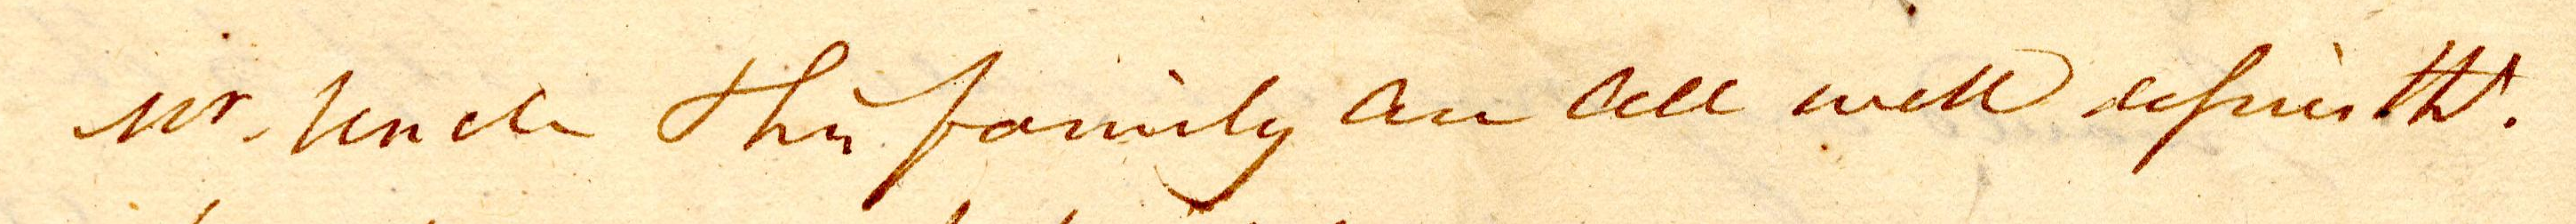My Uncle & his family are all well & send th^r.
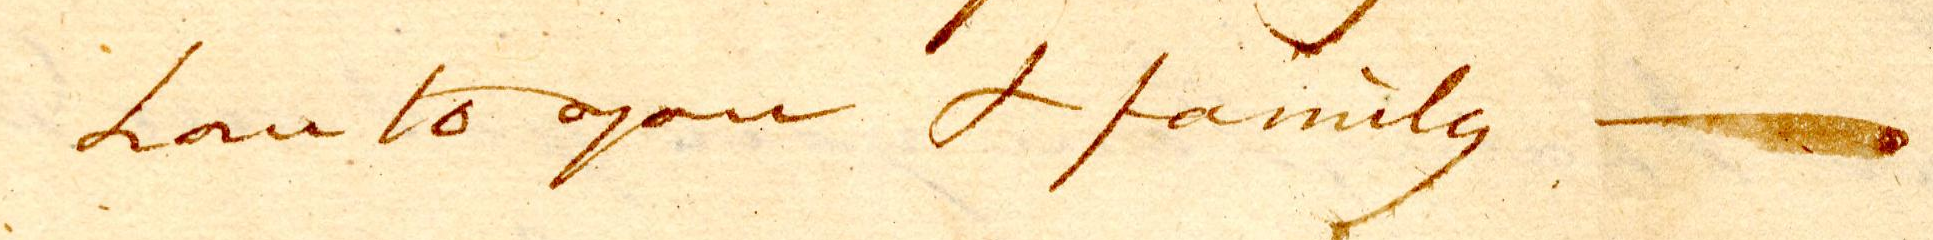love to you & family.-
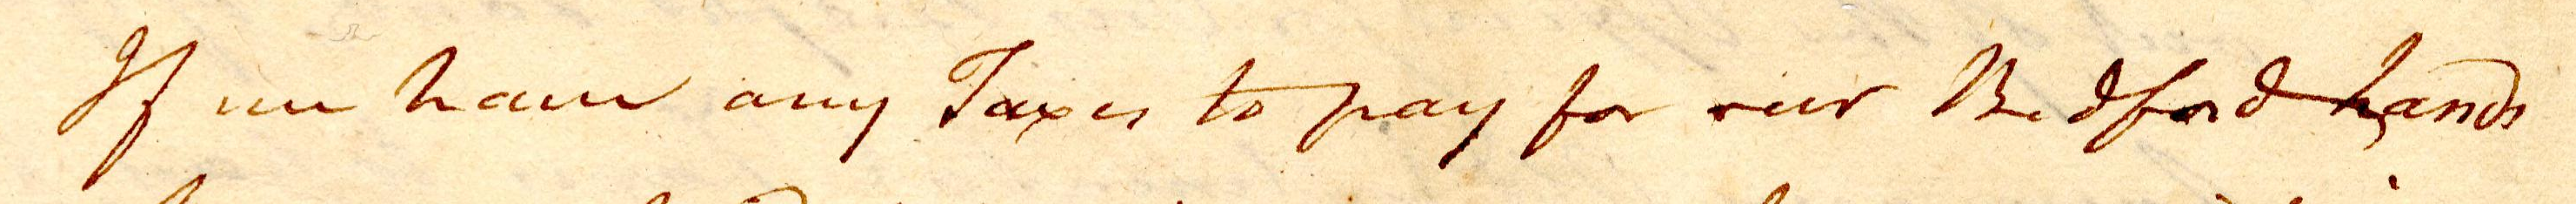If you have any Taxes to pay for your Bedford lands
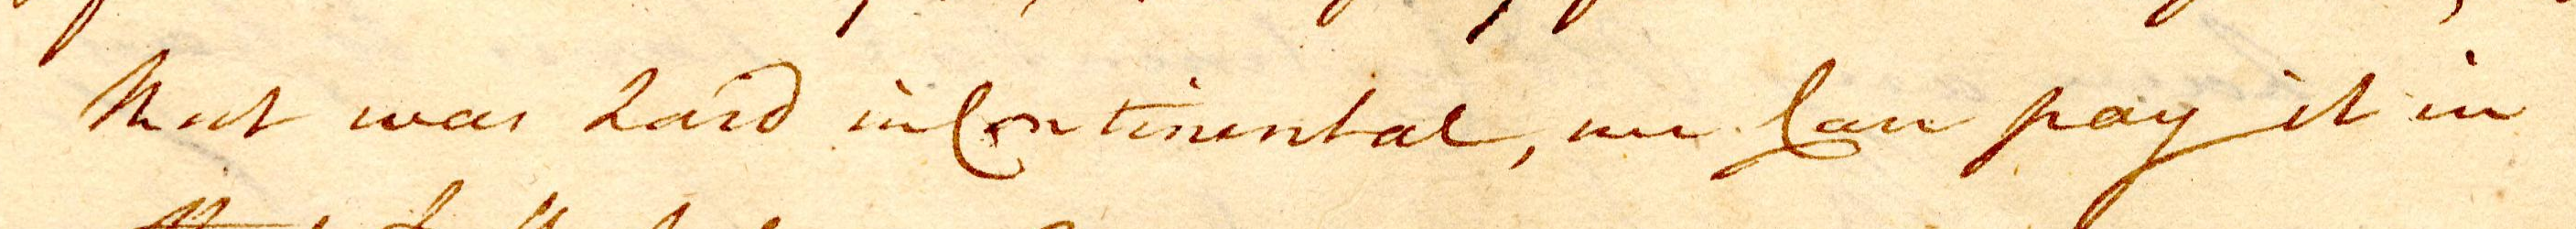but was Laid in Continental, we can pay it n
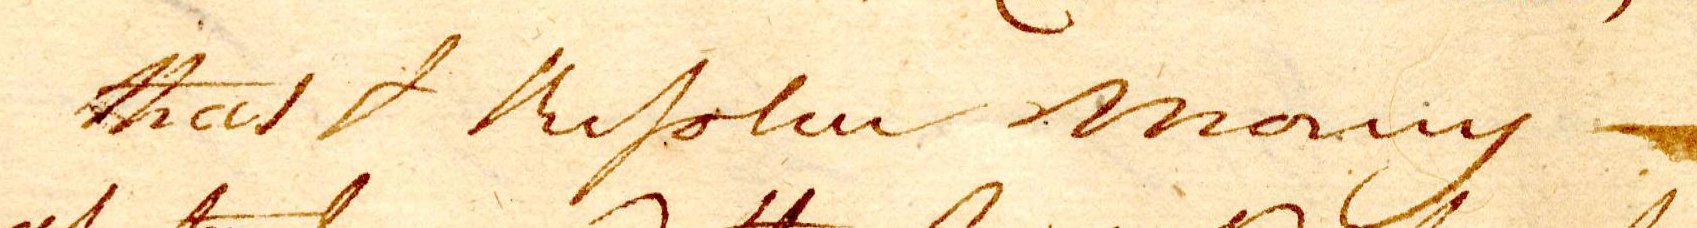that & Resolve Money
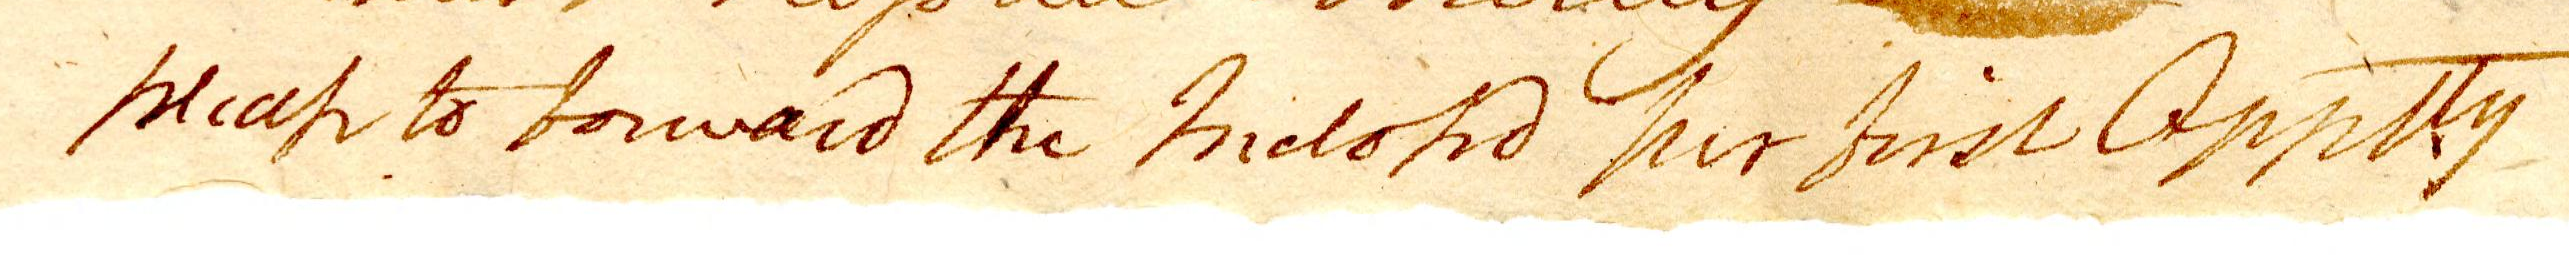please to forward the Inclos'd per first Opp^ty
